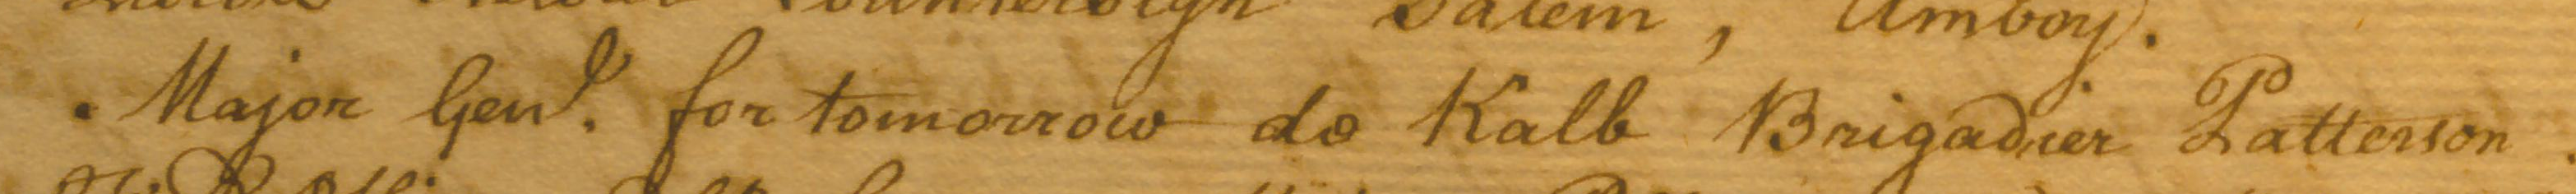Major Gen^l. for tomorrow de Kalb Brigadier Patterson
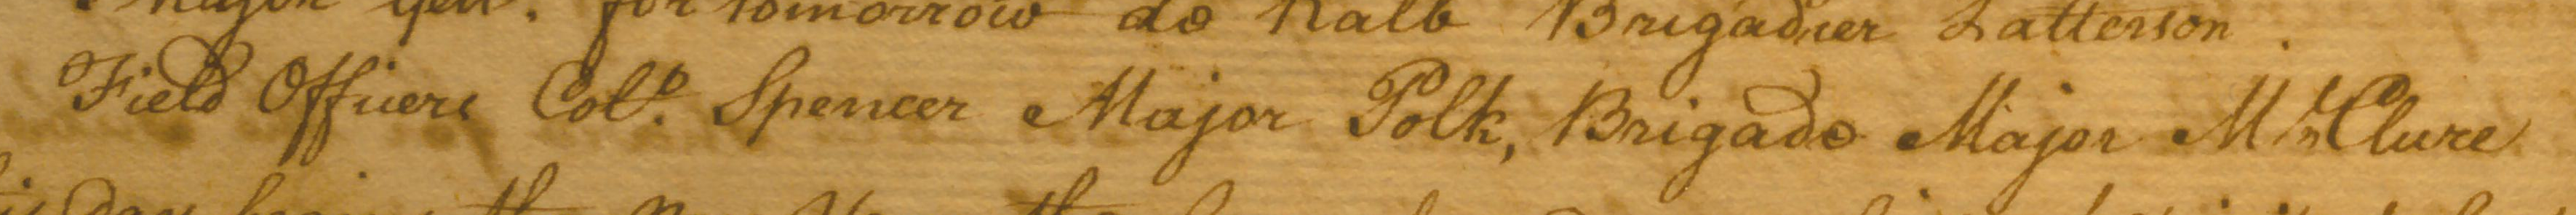Field Officers Col^o. Spencer Major Polk, Brigade Major M^c.Clure
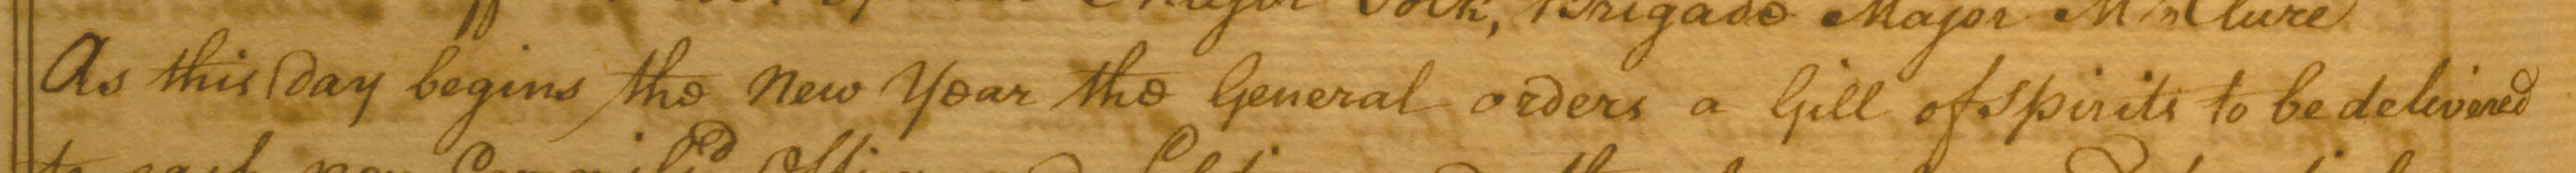As this day beings the new year the General orders a Gill of spirits to be delivered
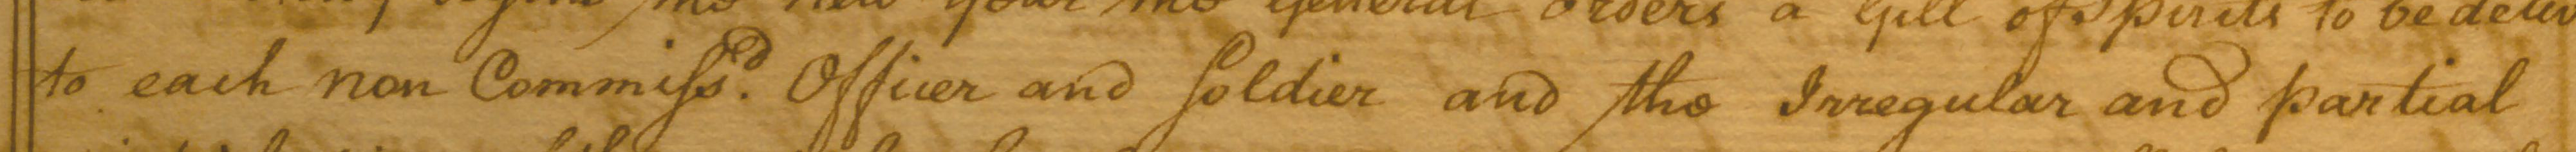to each non Commiss^d. Officer and Soldier and the Irregular and partial
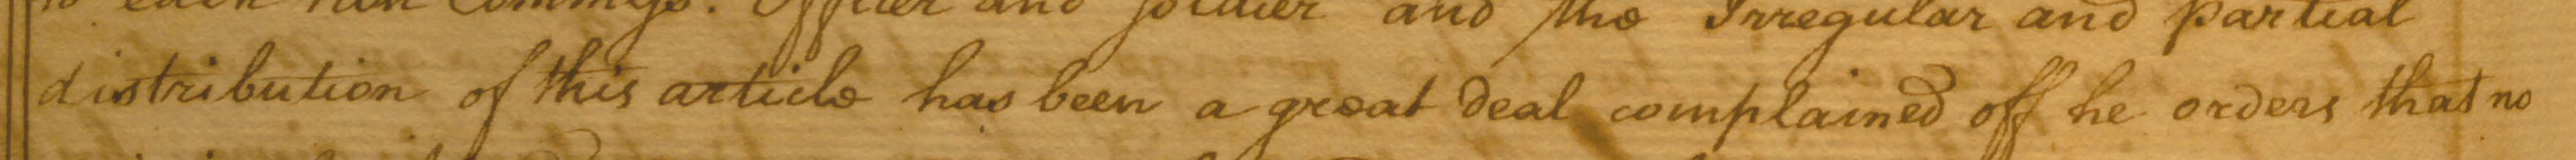distribution of this article has been a great deal complained off he orders that no
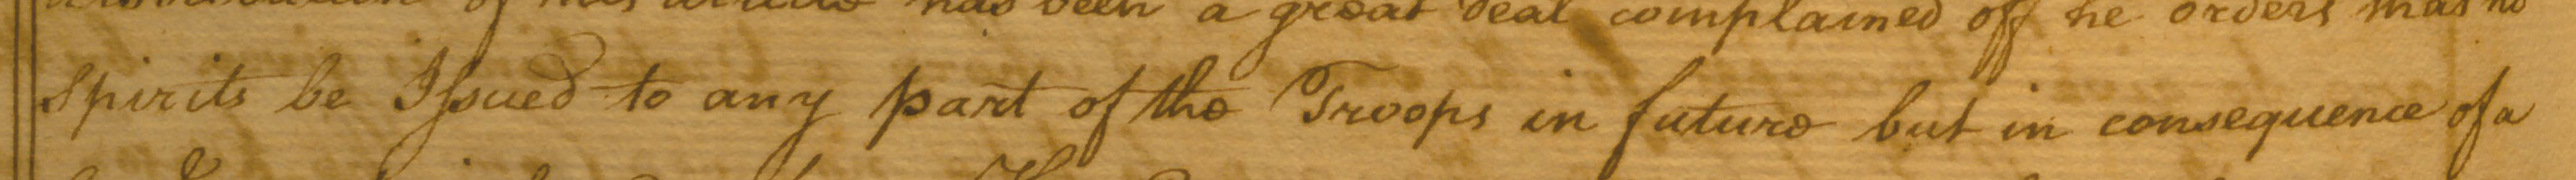spirits be Issued to any part of the Troops in future but in consequence of a
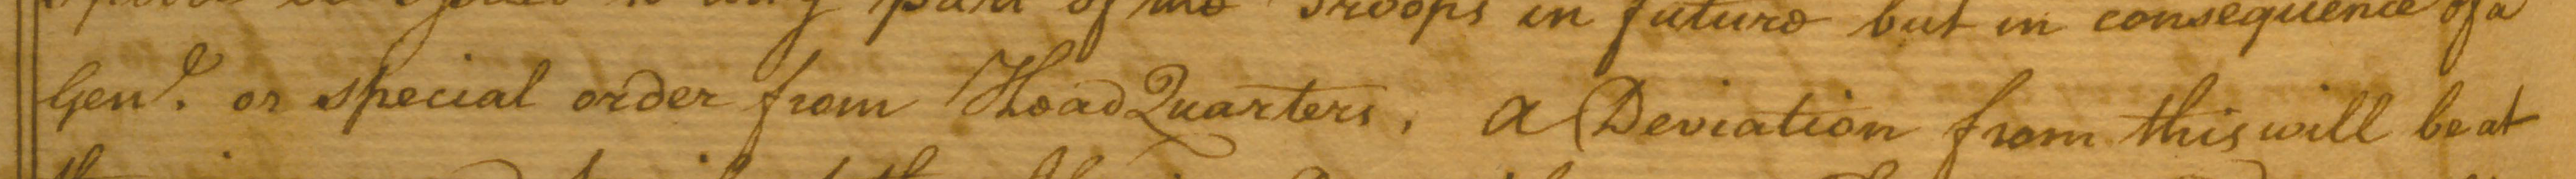Gen^l. or special order from Head Quarters, a Deviation from this will beat
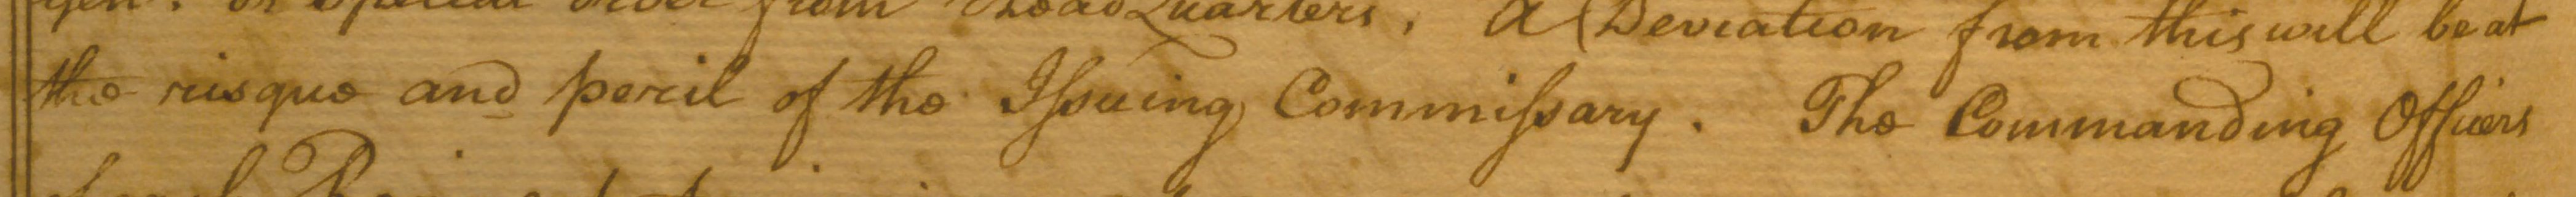the risque and peril of the Issuing Commissary. The Commanding Officers
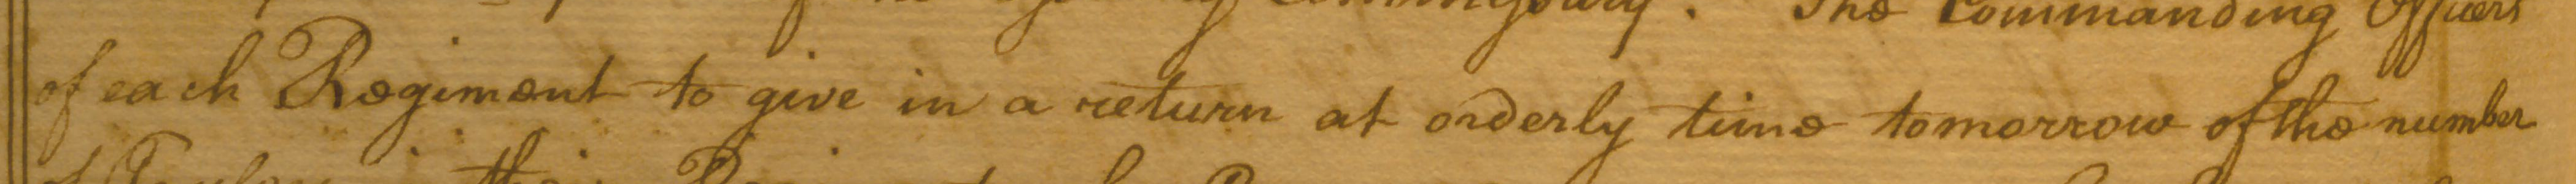of each Regiment to give in a return at orderly time tomorrow of the number
